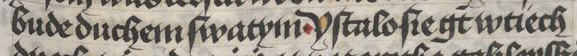bude duchem ſwatym.Y ſtalo ſie ḡt w tiech
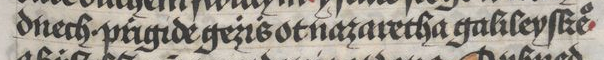díech.pṙigíde geżíṡ ot nazaretha galileyſkeo
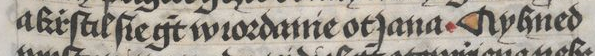a křſtil ſe ḡt wiordanie ot Iana. Ayhned
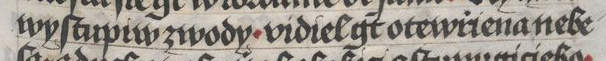vyẛtupiw z wody. vidiel ḡt otewṙiena nebe¬
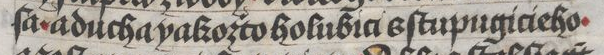ſa.a ducha yakožto holubici sſtupugicieho.
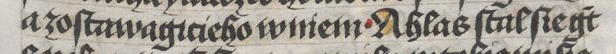a zoſtawagicíeho w niem. A hlas ſtal ſe ḡt
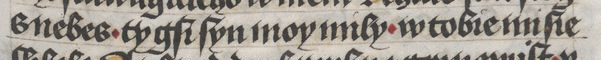s nebes.ty gſi ſyn moy mily.wtobie mi ſie
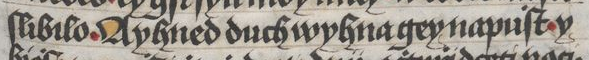ſlibulo.Ay hned duch wyhna gey napuẛt y
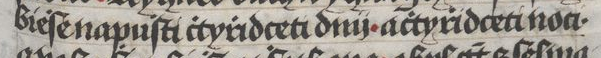bieẛe napuẛti ċtyṙidceti dnu.a ċtyṙidceti noci.
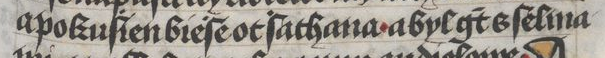a pokuẛíen bíeẛe ot ẛathana.a byl ḡt sſelma
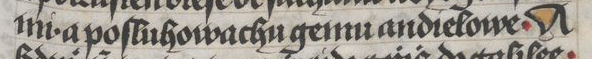mi.a poſluhowachu gemu andielowe. A
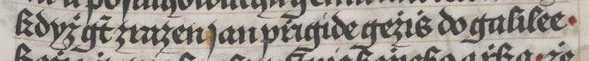kdyż ḡt zrazen pṙigide geżiṡ do galilee.
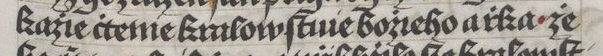każie čtenie kralowſtwie bożieho a ṙka.że
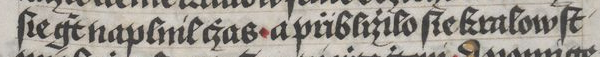ſe ḡt naplnil ċas.a pṙibližilo ſie kralowſt¬
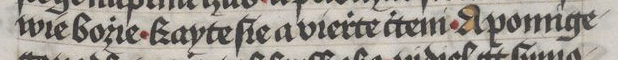wíe bożie.kayte ſie a vieṙte ċtení.A pomige¬
